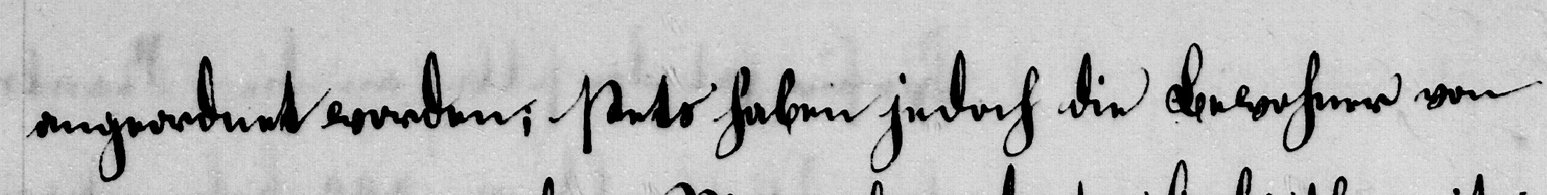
angeordnet worden; stets haben jedoch die Bewohner von
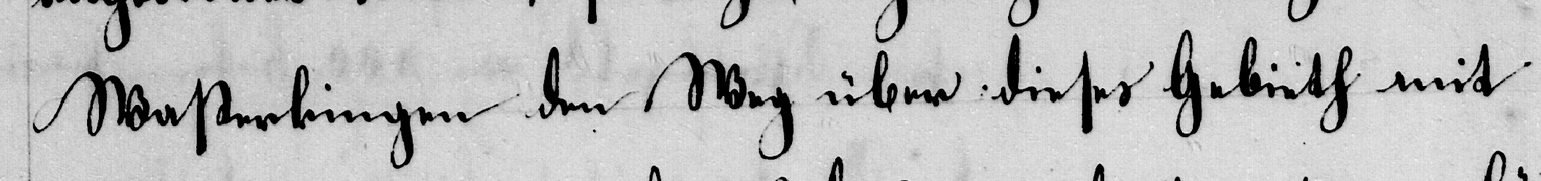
Wasterkingen den Weg über dieses Gebieth mit
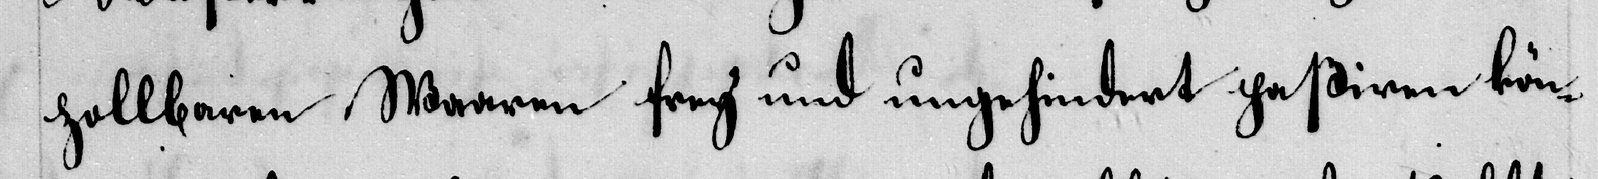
zollbaren Waaren frey und ungehindert paßiren kön¬
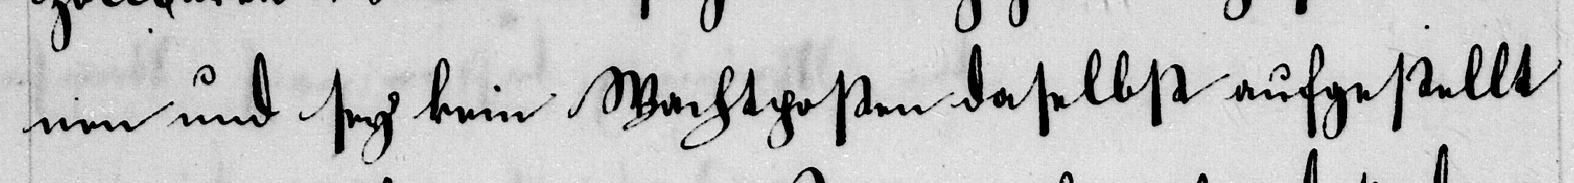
nen und sey kein Wachtposten daselbst aufgestellt
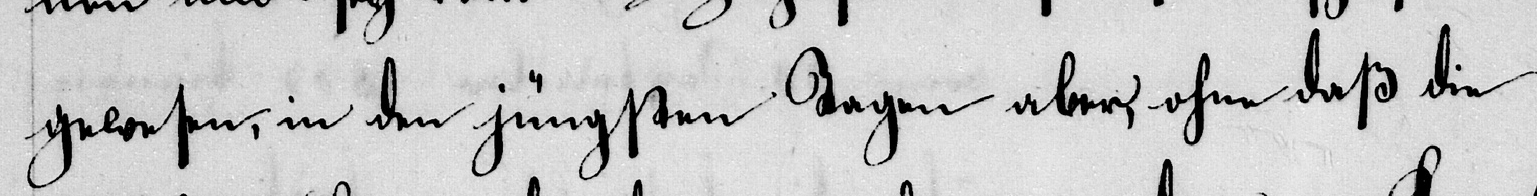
gewesen, in den jüngsten Tagen aber, ohne daß die
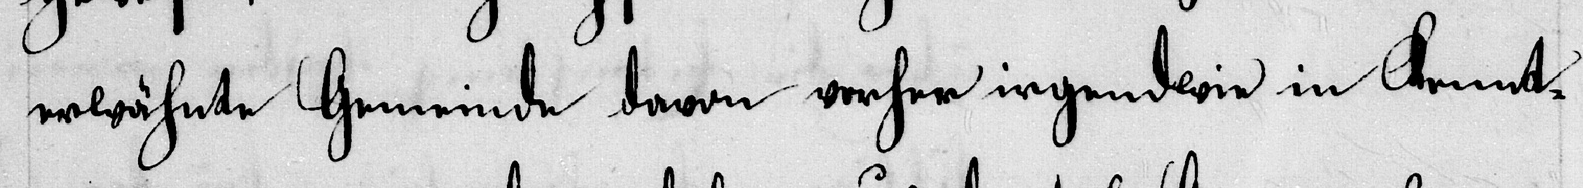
erwähnte Gemeinde davon vorher irgendwie in Kennt¬
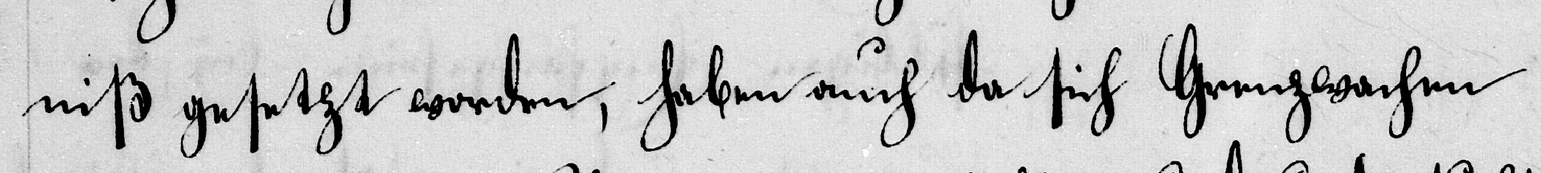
niß gesetzt worden, haben auch da sich Grenzwachen
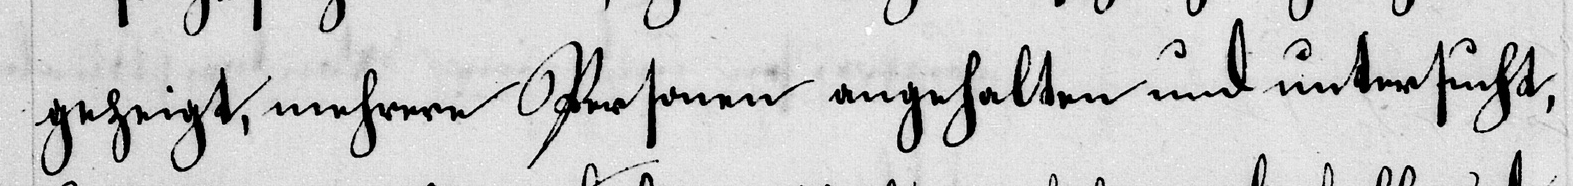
gezeigt, mehrere Personen angehalten und untersucht,
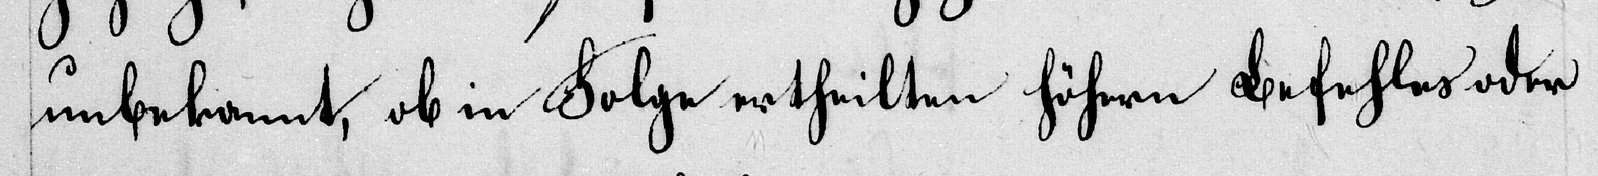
unbekannt, ob in Folge ertheilten höhern Befehls oder
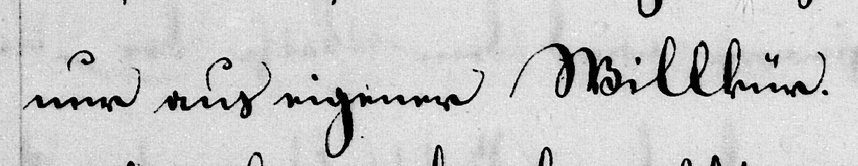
nur aus eigener Willkür.
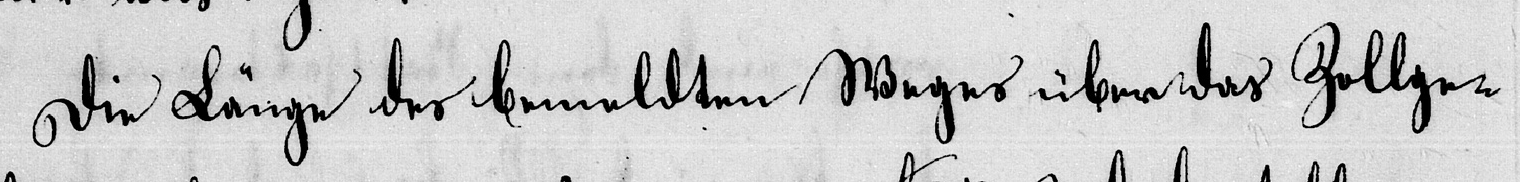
Die Länge des bemeldten Weges über das Zollge¬
